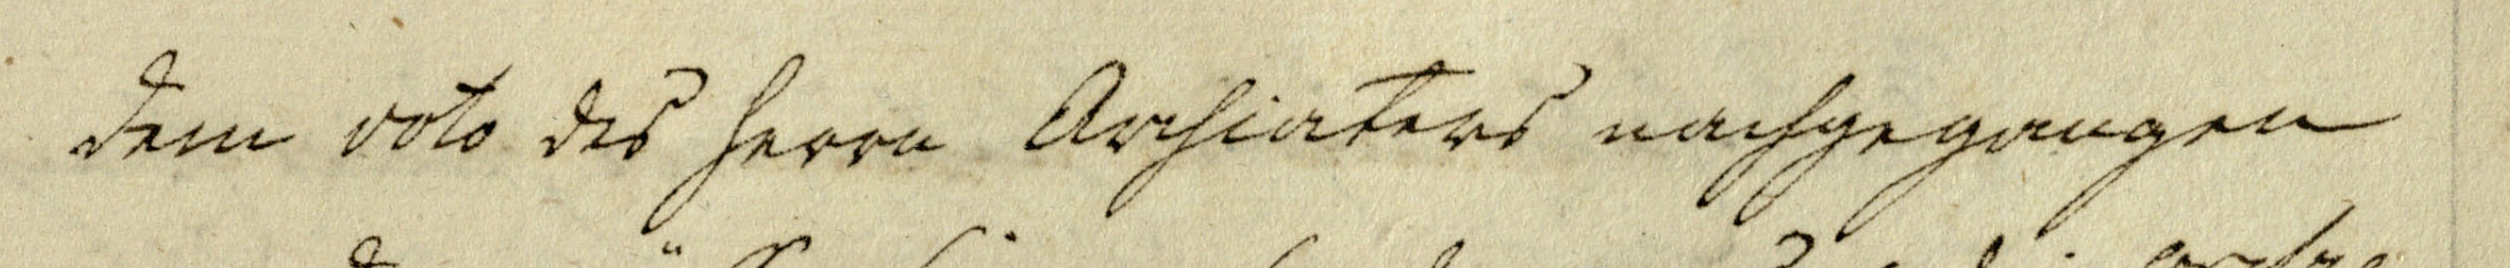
dem voto des Herrn Archiaters nachgegangen
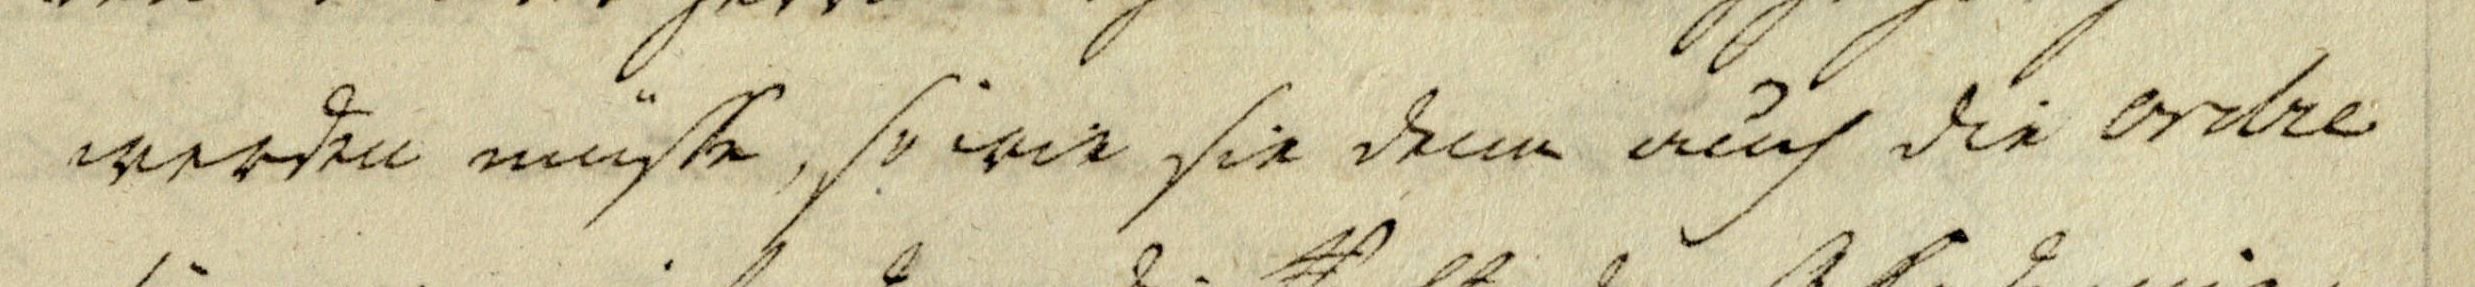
werden müsse, so wie sie denn auch die Ordre
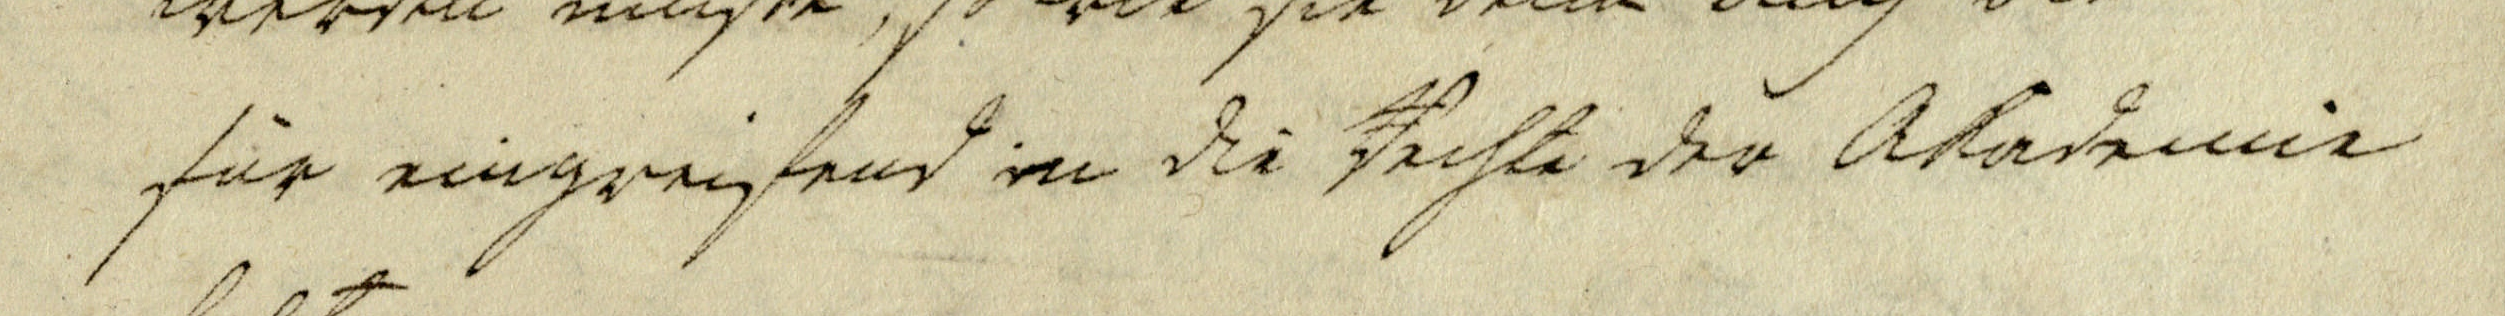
für eingreifend in die Rechte der Akademie
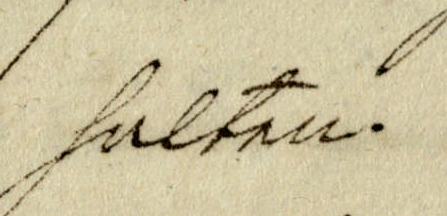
halten.
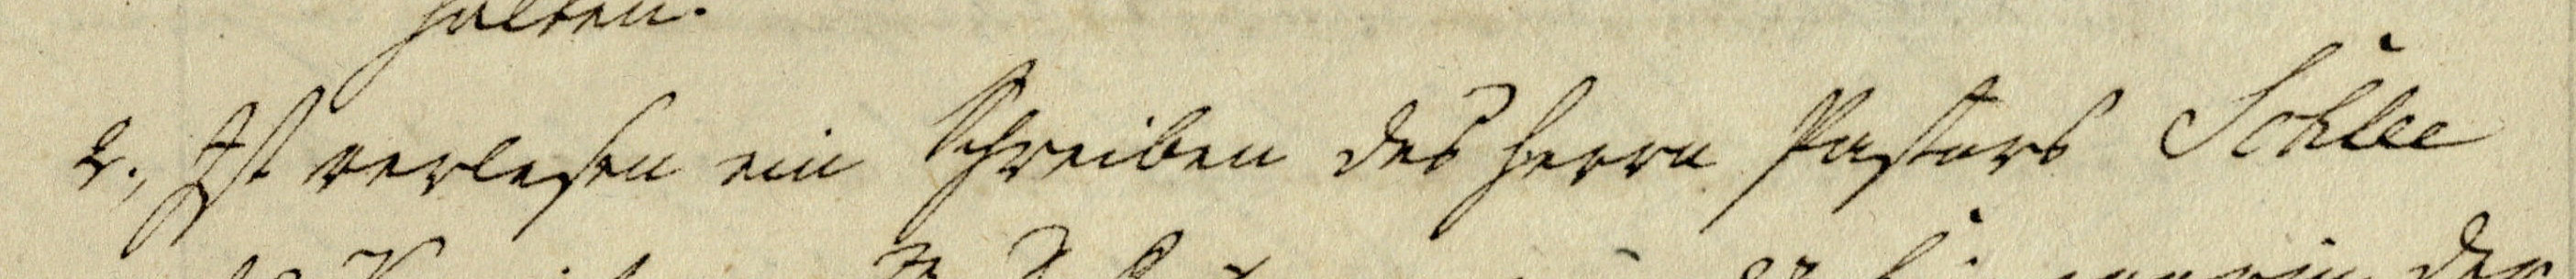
2., Ist verlesen ein Schreiben des Herrn Pastors Schlee
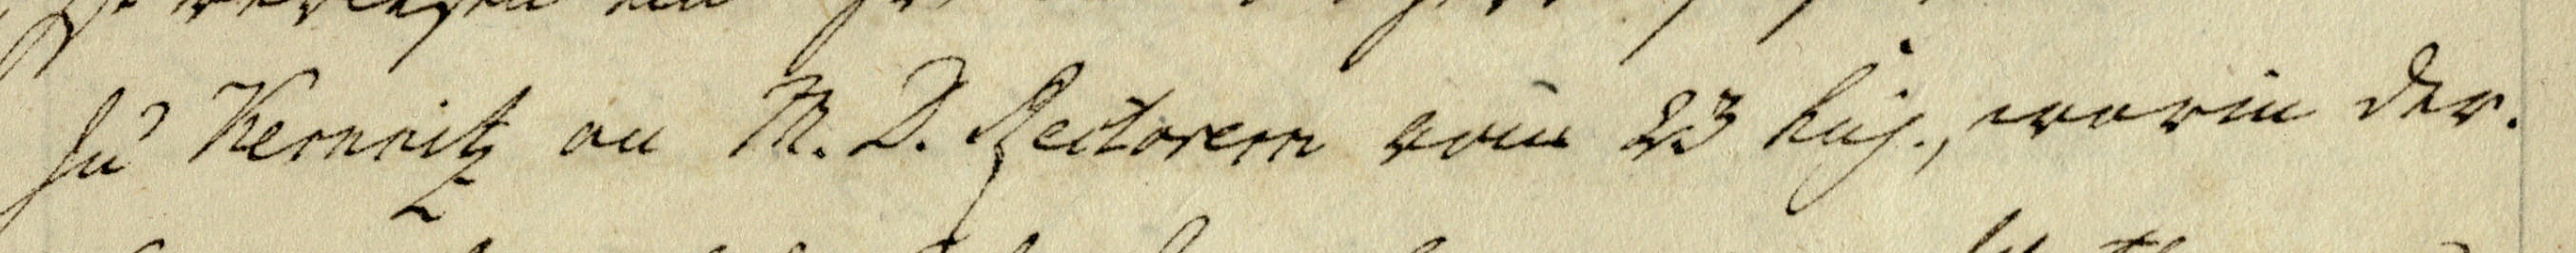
zu Kemnitz an M. D. Rectorem vom 23 huj., worin der¬
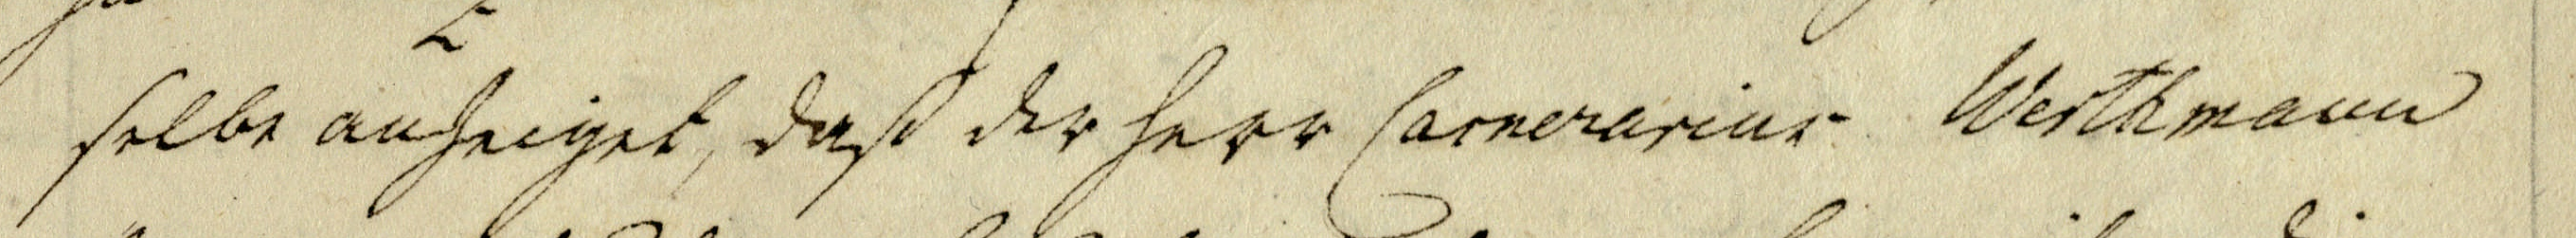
selbe anzeiget, daß der Herr Camerarius Werthmann
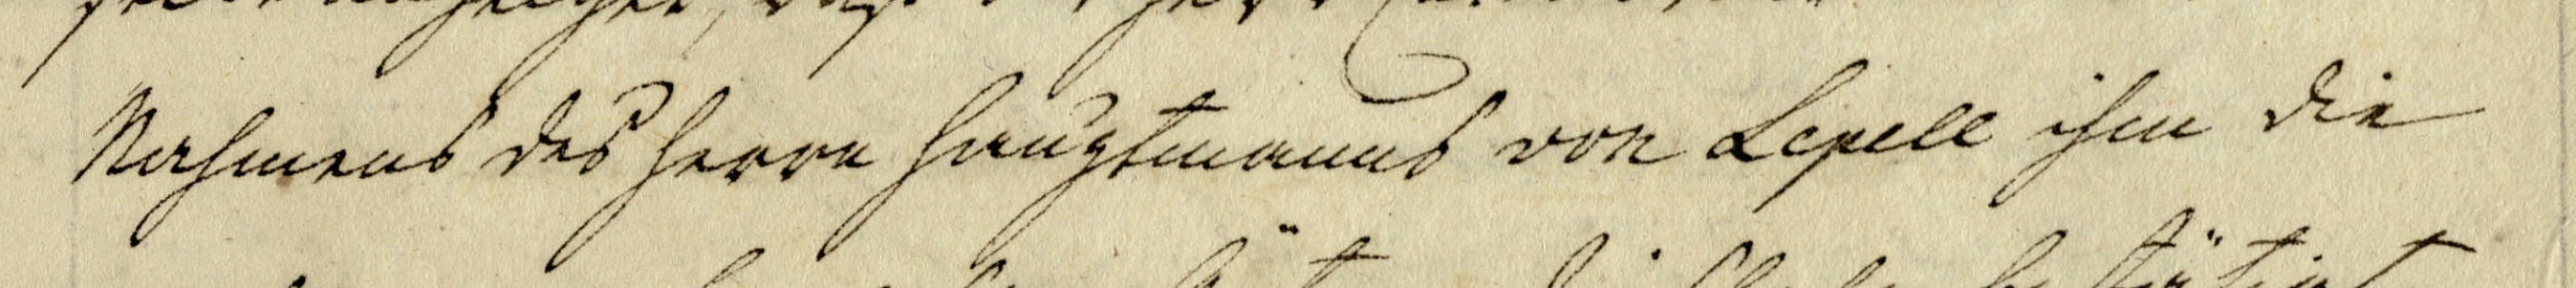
Nahmens des Herrn Hauptmanns von Lepell ihm die
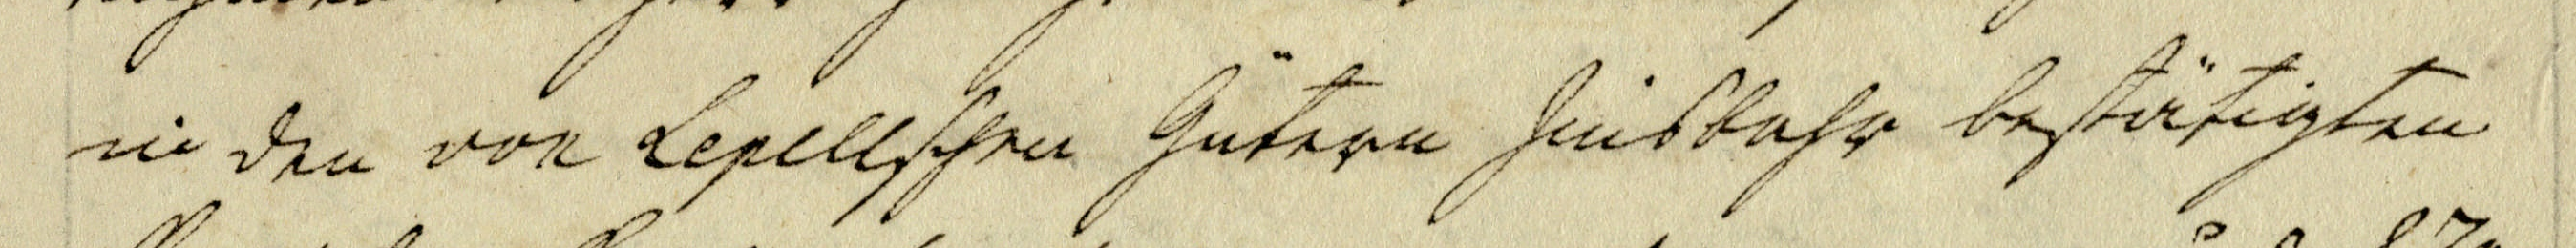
in den von Lepellschen Gütern zinsbahr bestätigten
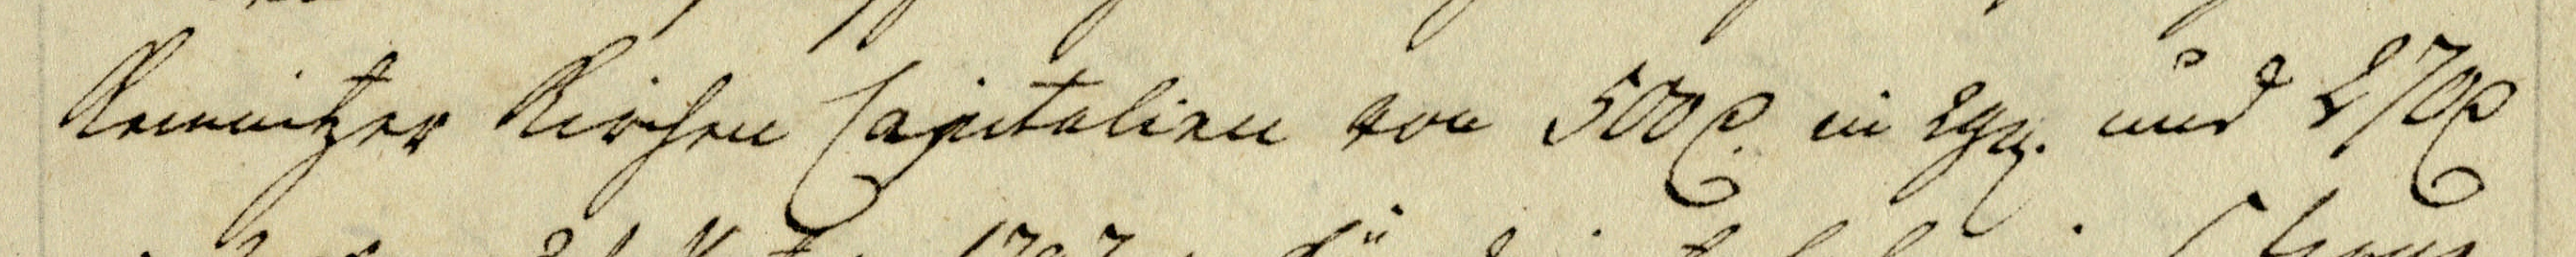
Kemnitzer Kirchen Capitalien von 500 l. in 2g. und 270 l
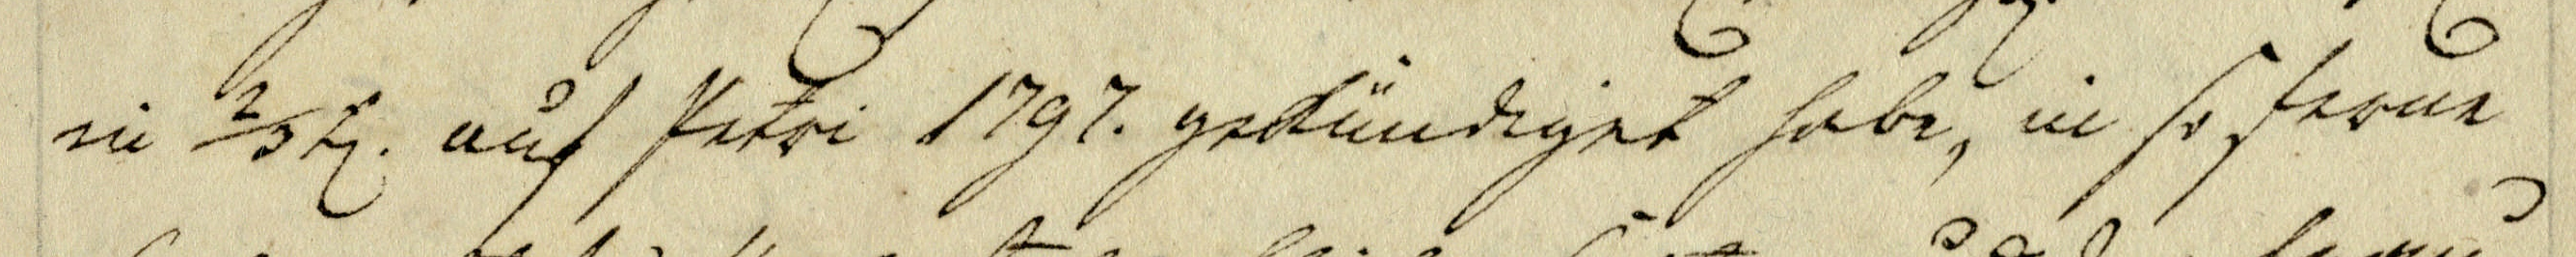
in 2/3 t. auf Petri 1797. gekündiget habe, in so ferne
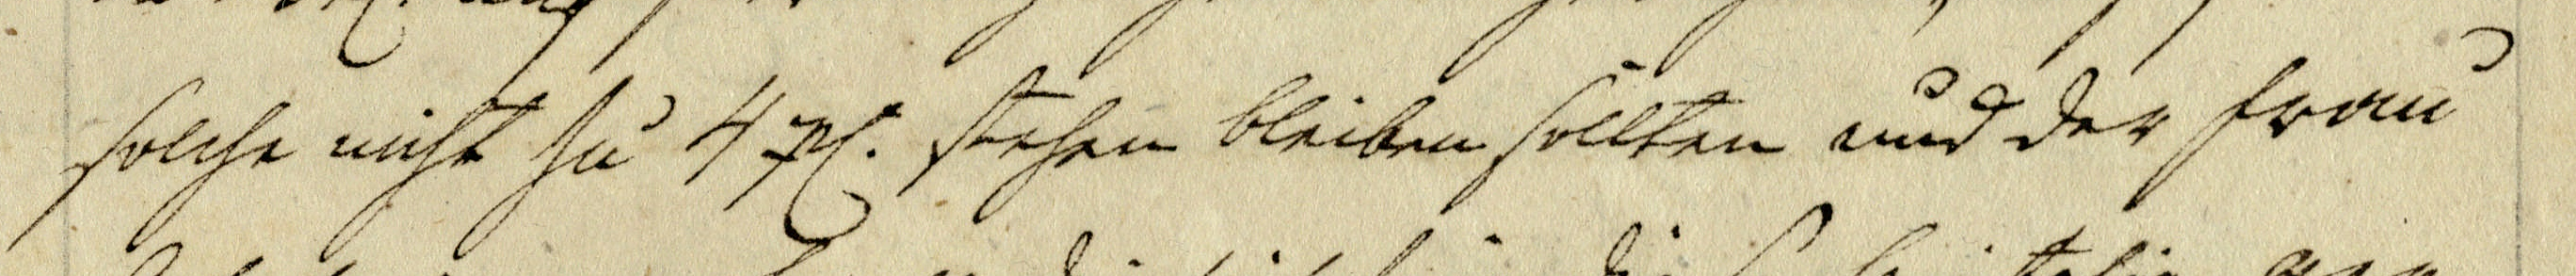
solche nicht zu 4 pt. stehen bleiben sollten und der Frau
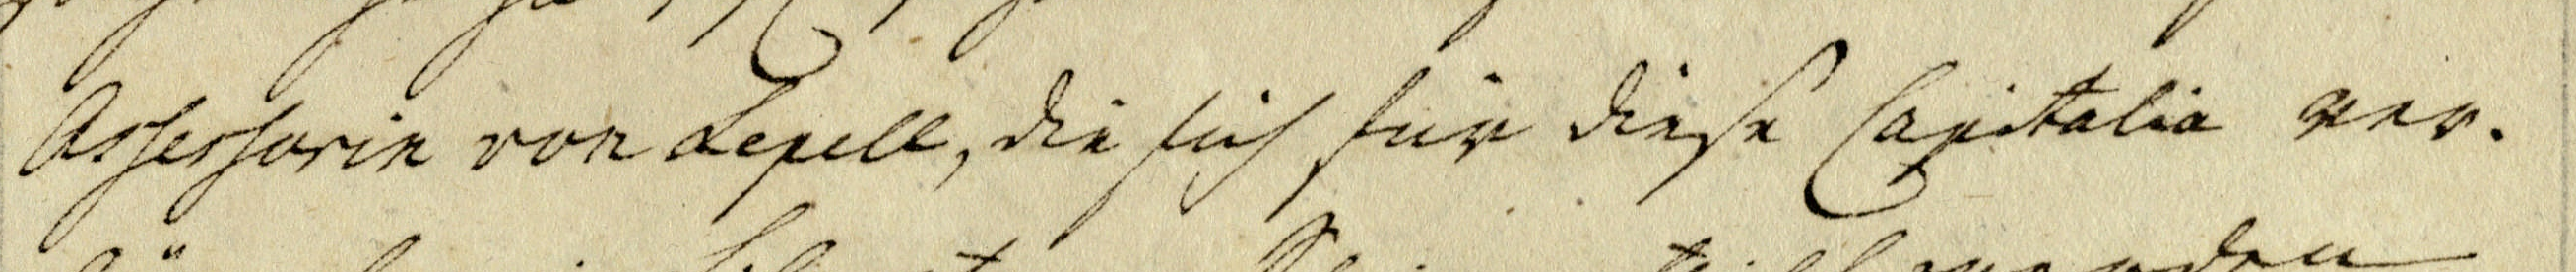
Assessorin von Lepell, die sich für diese Capitalia ver¬
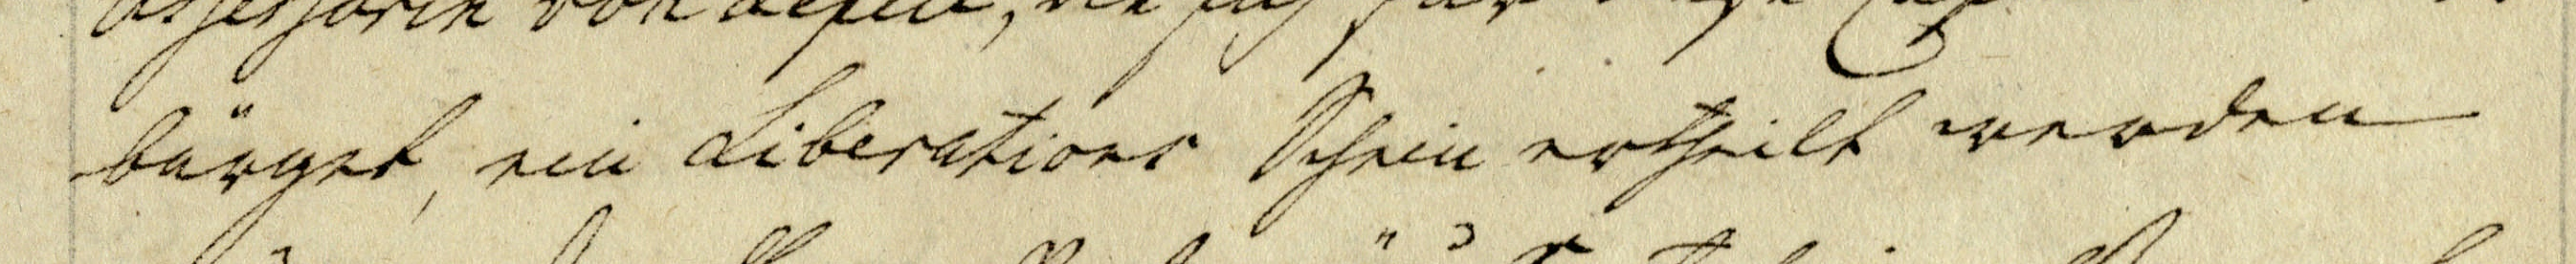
bürget, ein Liberations Schein ertheilt werden
